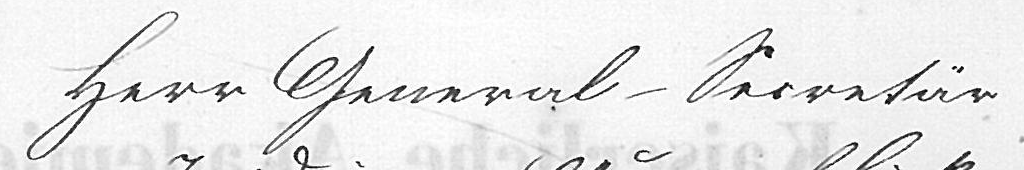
Herr General-Secretär
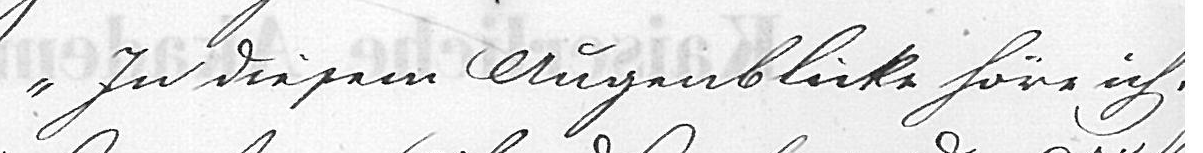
" In diesem Augenblicke höre ich,
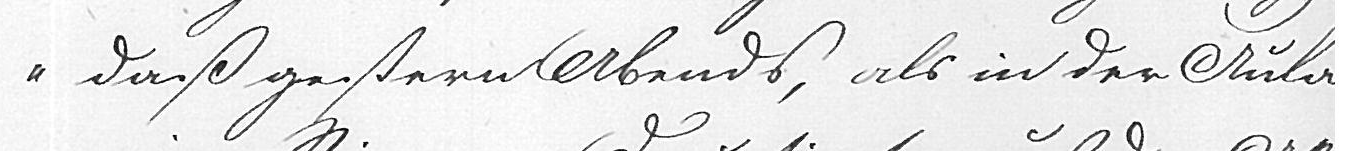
" daß gestern Abends, als in der Aula
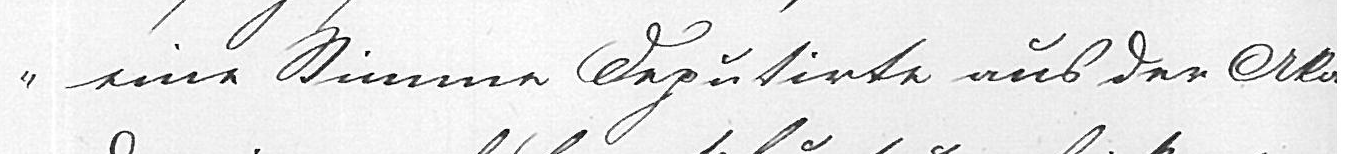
" eine Stimme Deputirte aus der Aka-
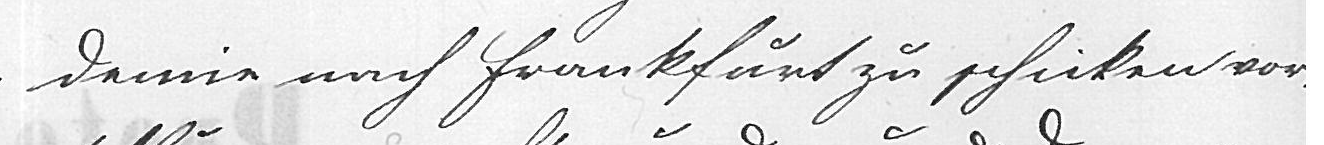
" demie nach Frankfurt zu schiken vor-
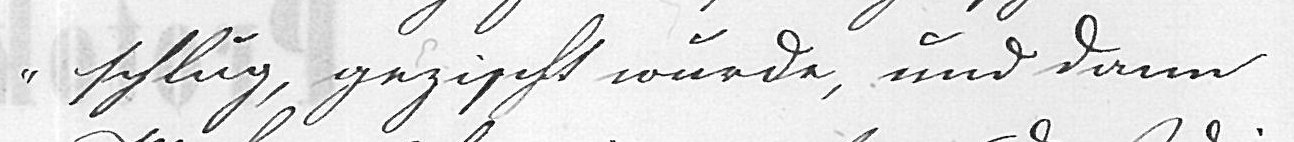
" schlug, gezischt wurde, und dann
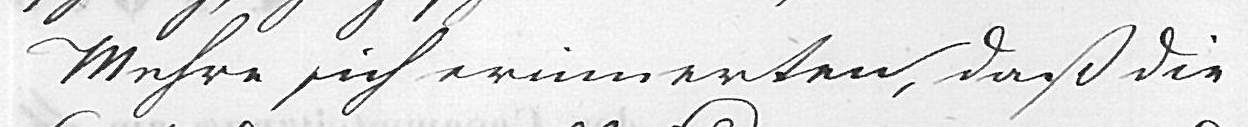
" Mehre sich erinnerten, daß die
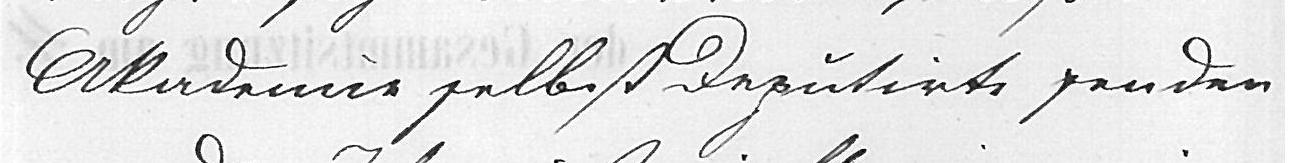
" Akademie selbst Deputirte senden
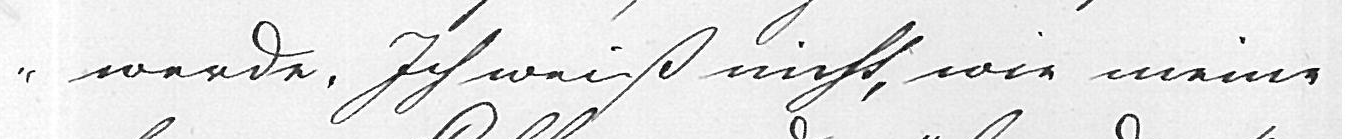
" werde. Ich weiß nicht, wie meine
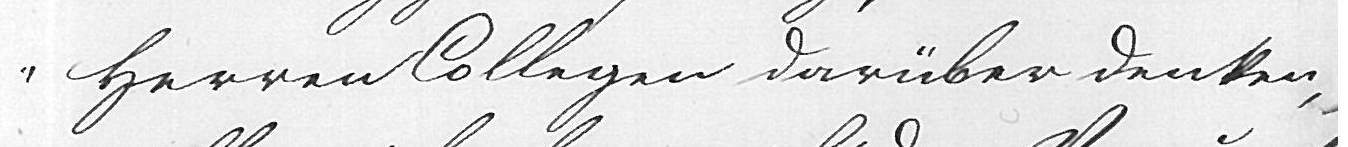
" Herren Collegen darüber denken,
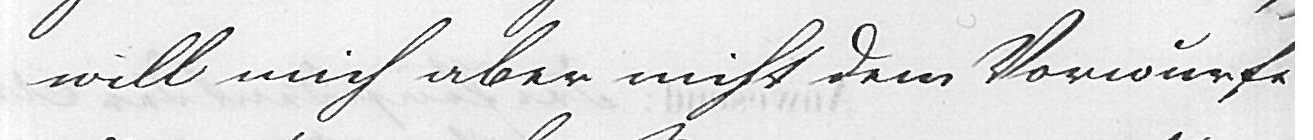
" will mich aber nicht dem Verwurfe
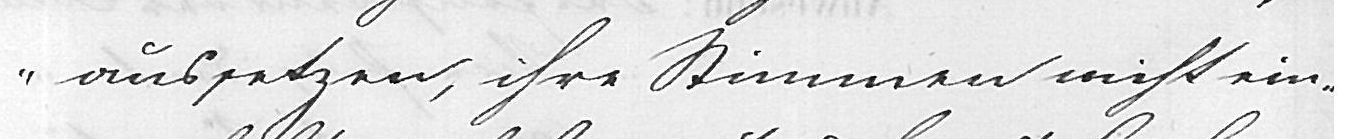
" aussetzen, ihre Stimmen nicht ein-
